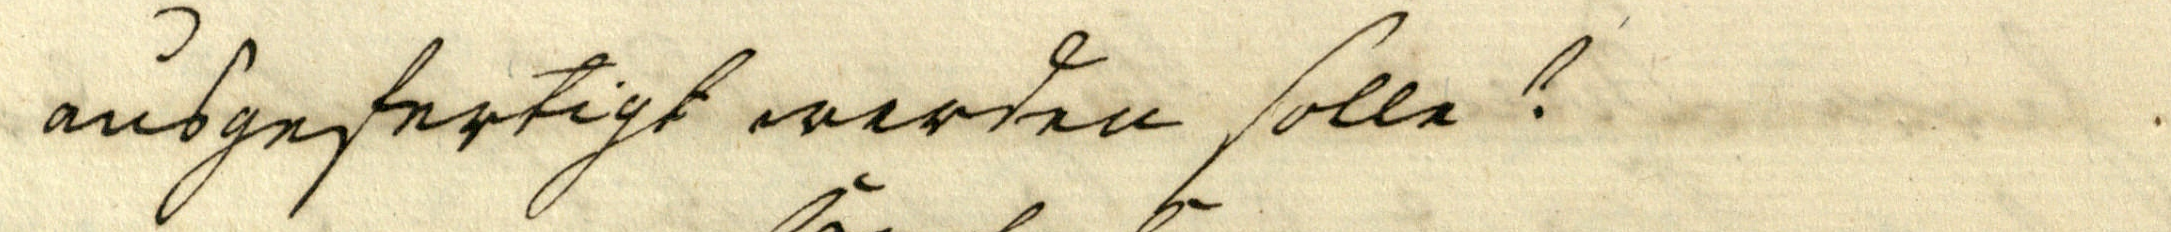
ausgefertigt werden solle?
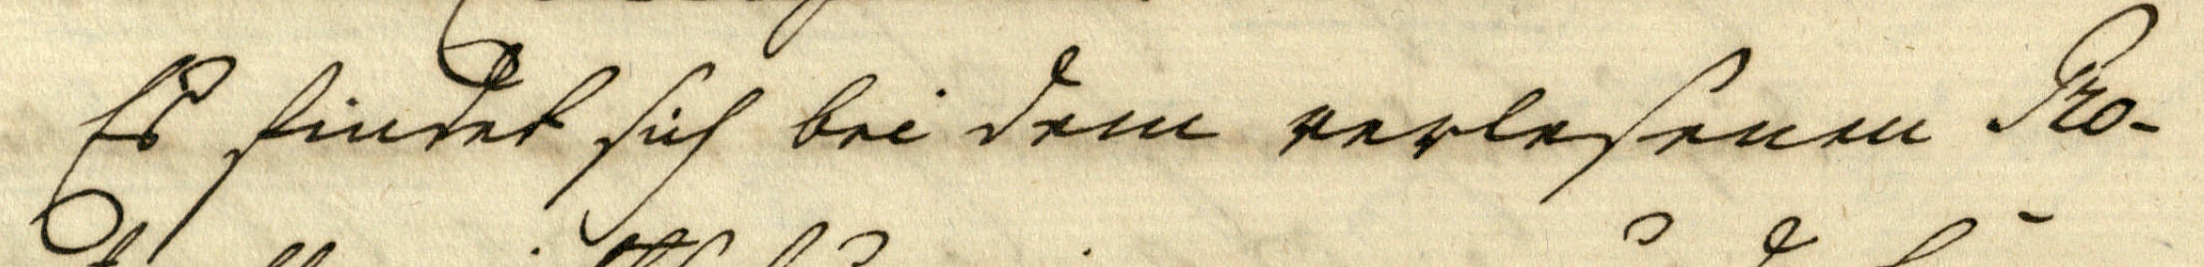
Es findet sich bei dem verlesenen Pro-
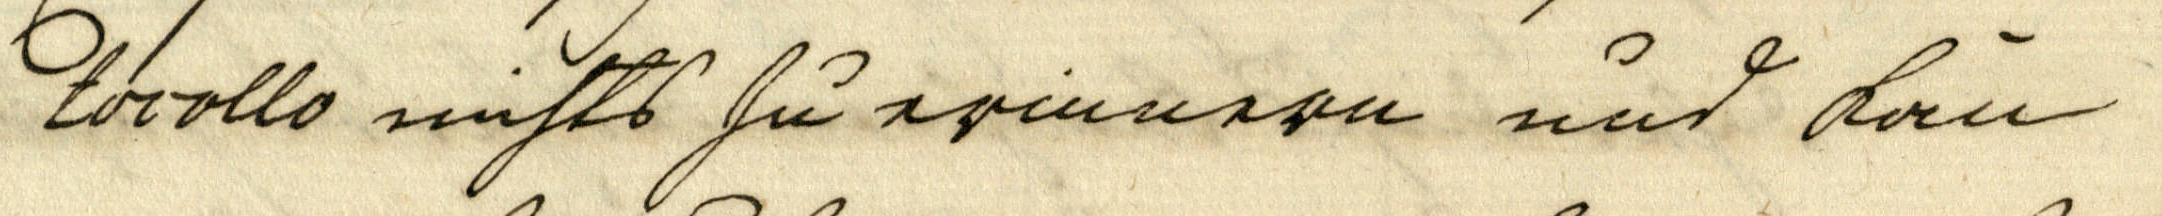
tocollo nichts zu erinnern und kan
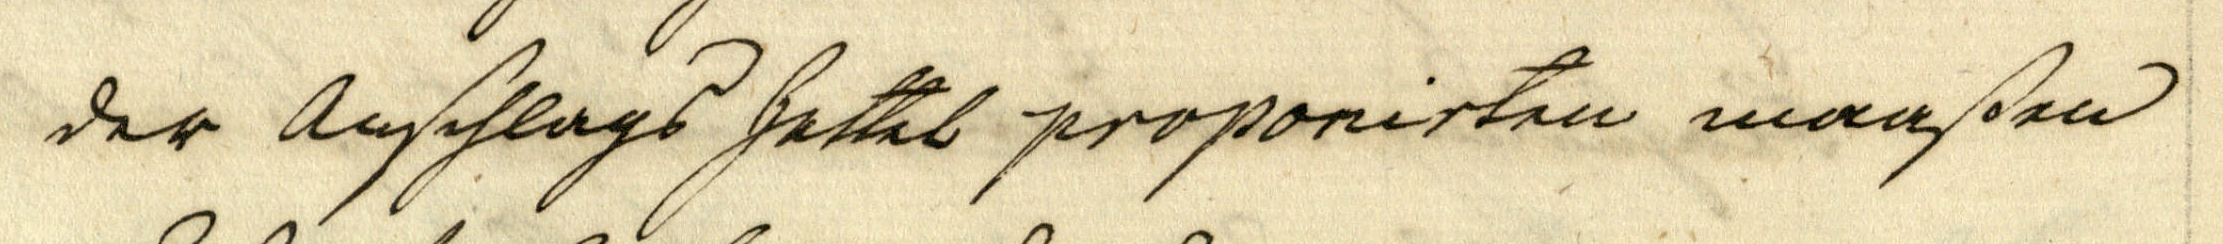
der Anschlags Zettel proponirten maaßen
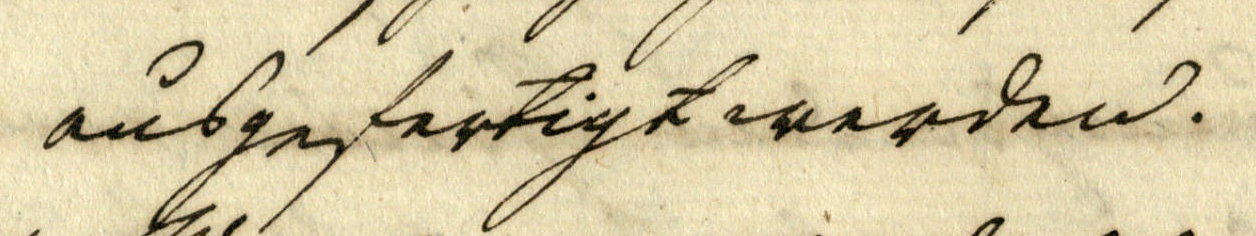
ausgefertigt werden.
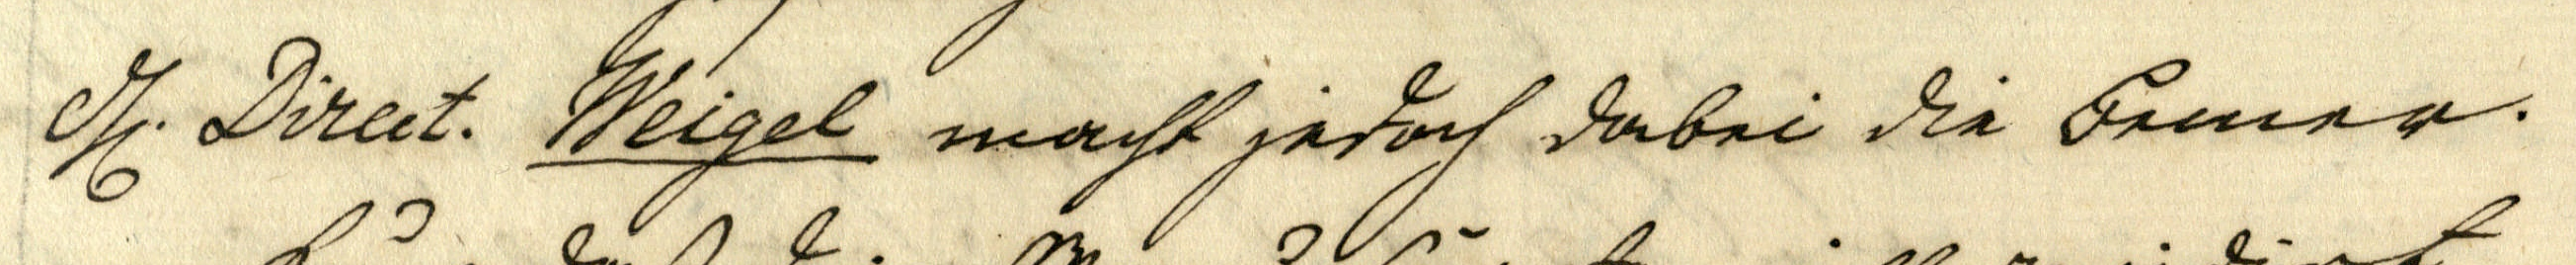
dh. Direct. Weigel macht jedoch dabei die Bemer-
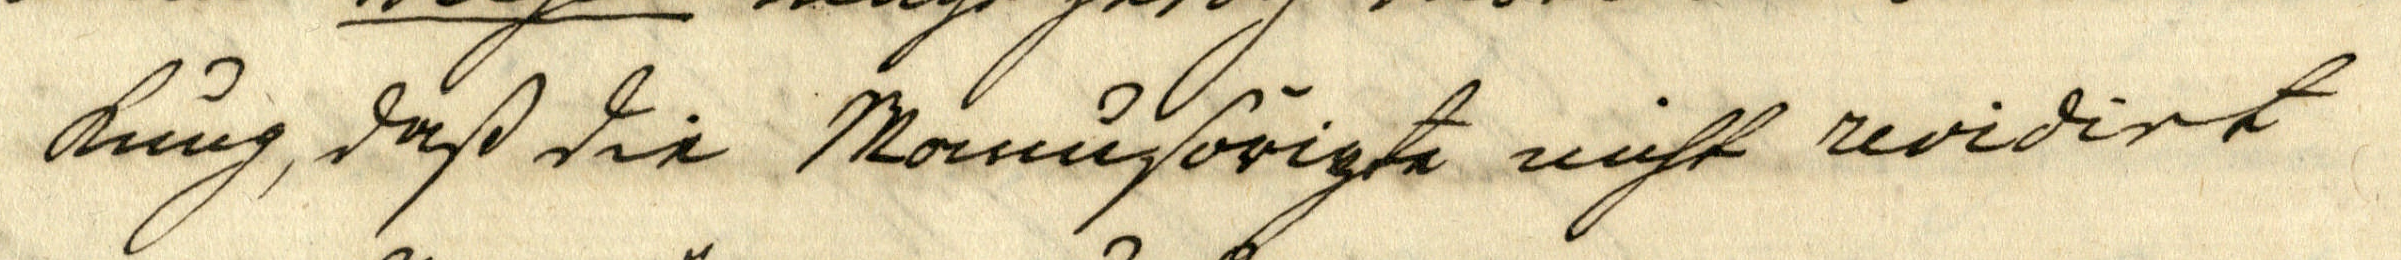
kung, daß die Manuscripte nicht revidirt
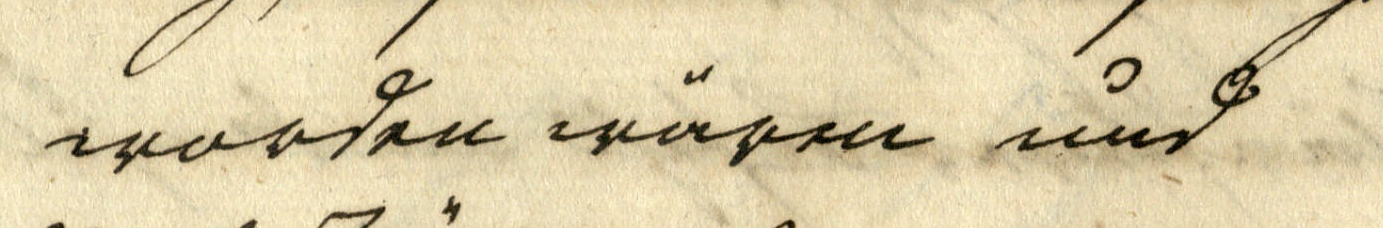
worden wären und
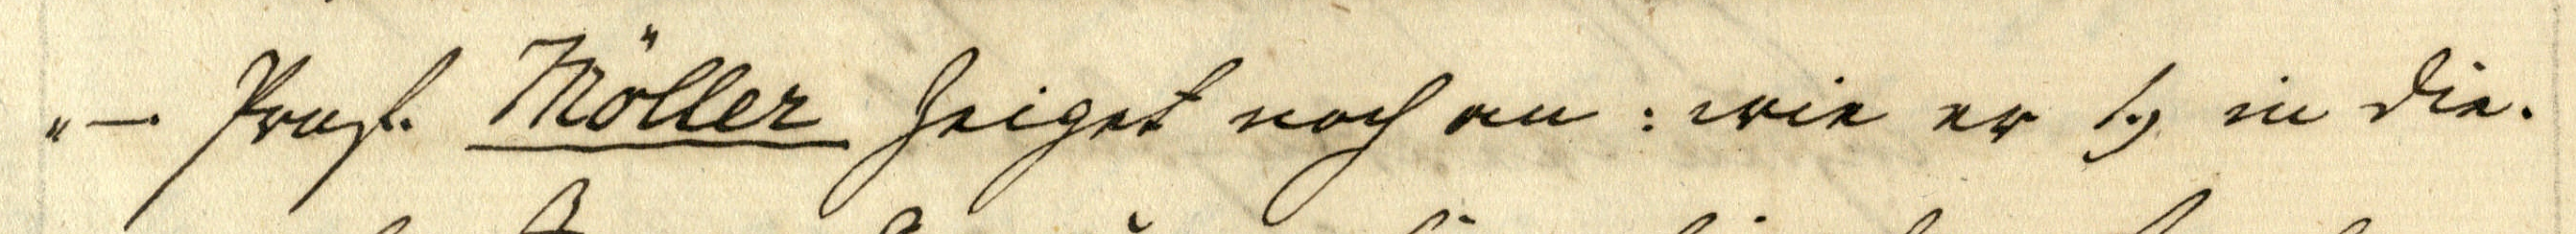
" - Prof. Möller zeiget noch an: wie er 1., in die-
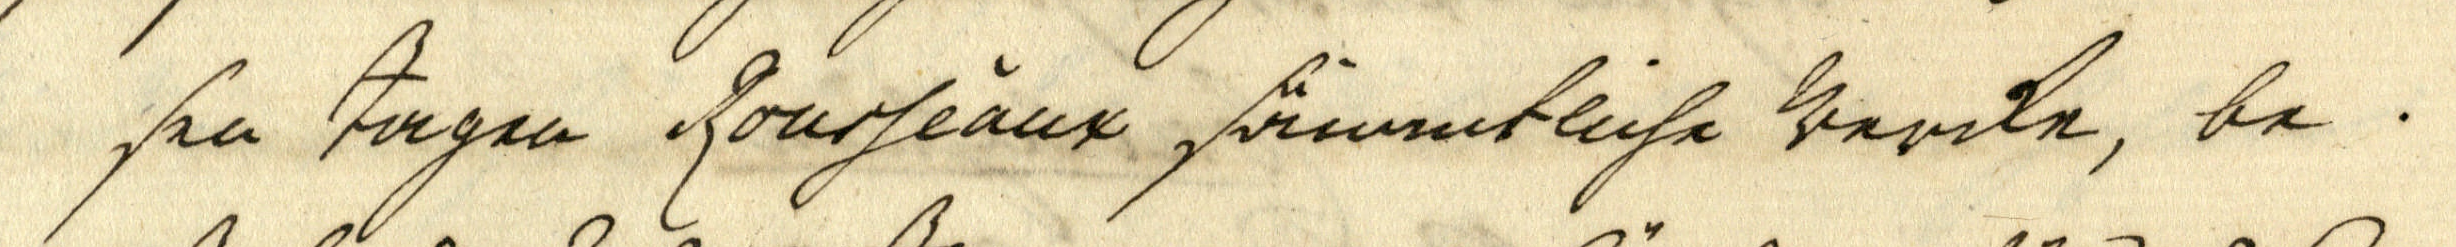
sen Tagen Rousseaux sämmtliche Werke, be-
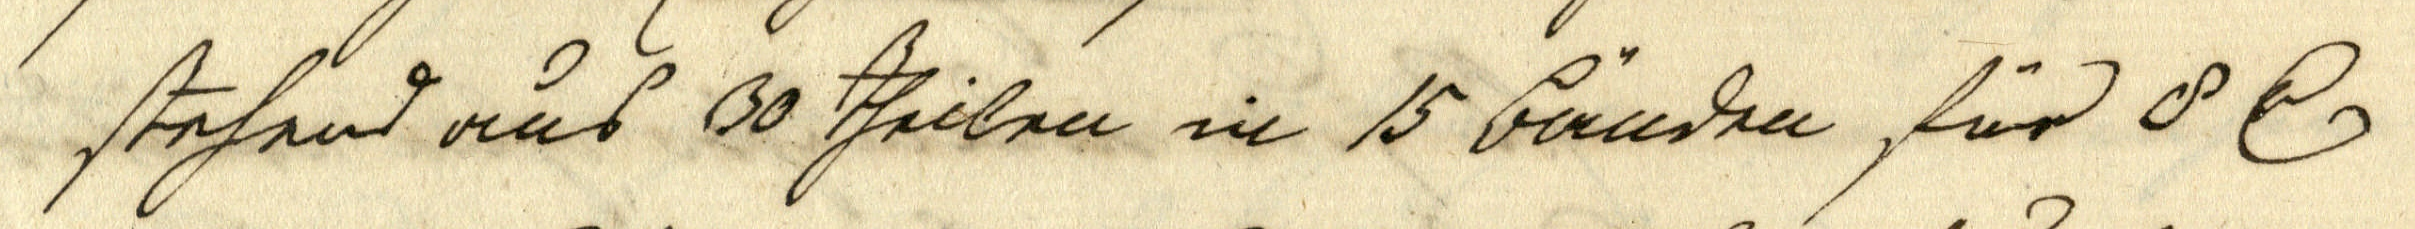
stehend aus 30 Theilen in 15 Bänden für 8 rtl
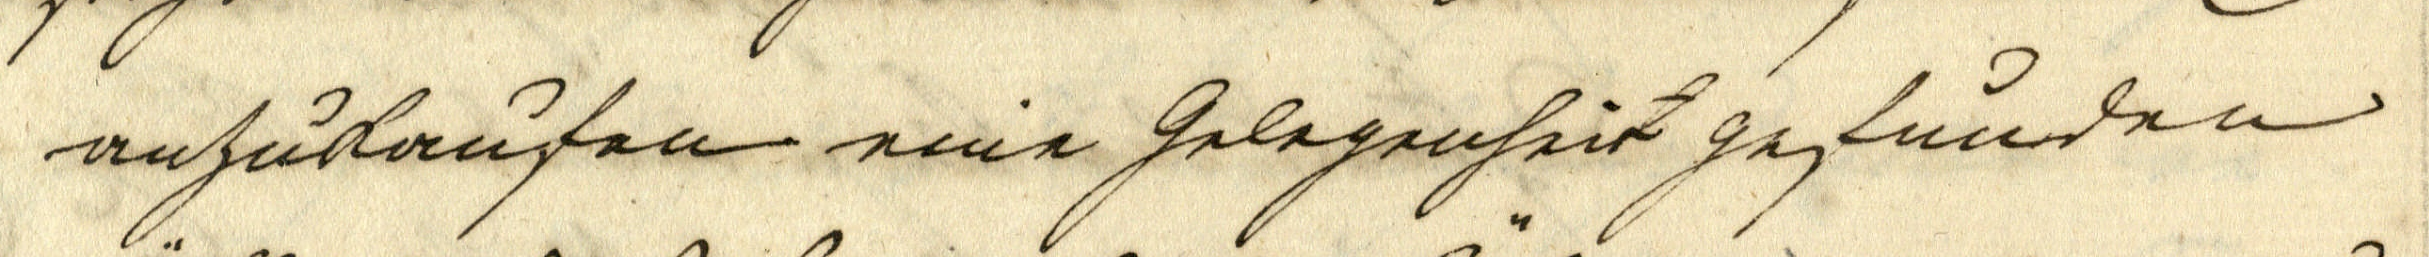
anzukaufen eine Gelegenehit gefunden
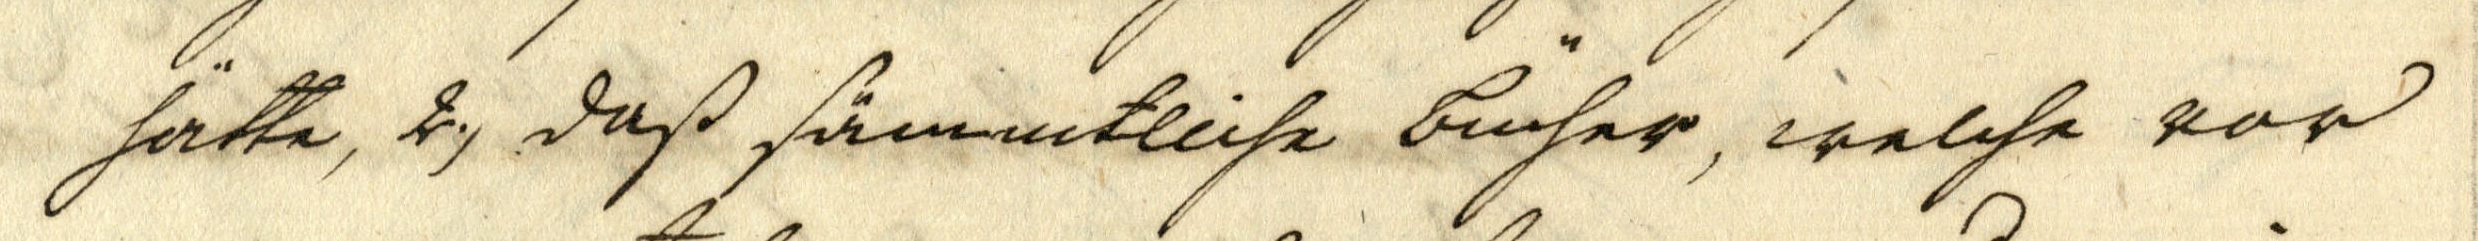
hätte, 2., daß sämmtliche Bücher, welche vor
